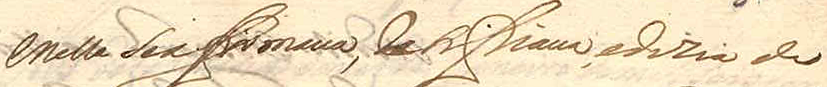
e nella se affirmaua, Ratificaua, e dizia de
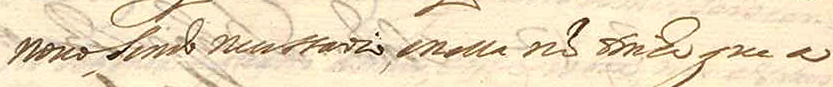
nouo sendo necessario, e nella nā tinha que a
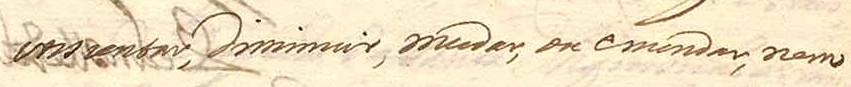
crescentar, diminuir, mudar, ou emendar, nem
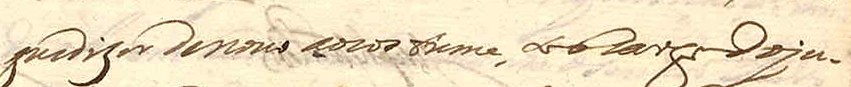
que dizer de nouo ao costume sob cargo do ju
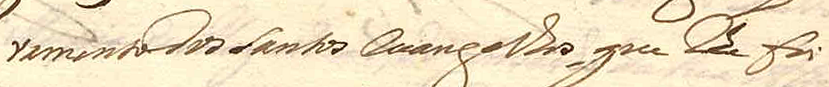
ramento dos santos euangelhos, que lhe foi
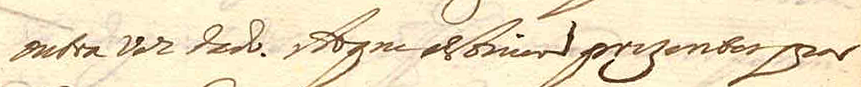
outra vez dado. Ao que estiuerā prezentes por
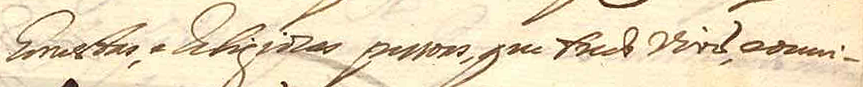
honestas, e Religiozas pessoas, que tudo virā, e ouui
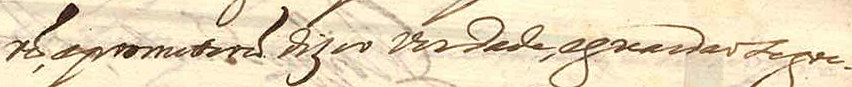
rā, e prometerā dizer verdade, e guardar segre
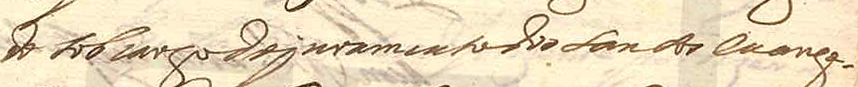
do sob cargo do juramento dos santos euange
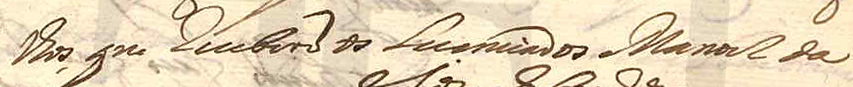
lhos, que Receberā os Lecenciados Manoel da
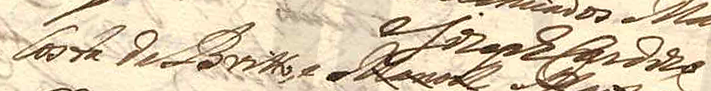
Costa de Britto, e Jozeph Cardozo
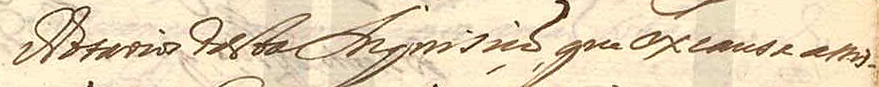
Notarios desta Inquisiçā, que ex causa assis
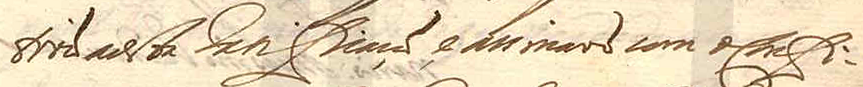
tirā a esta Ratificaçā, e assinarā com o Confi
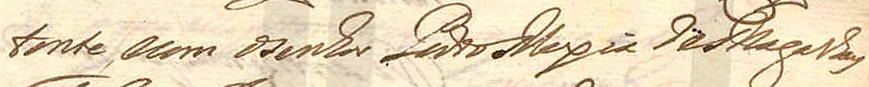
tente, e com o senhor Pedro Mexia de Magalhaes
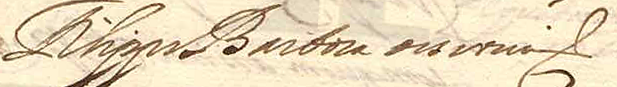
Filippe Barbosa o escreui
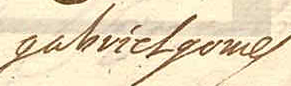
gabriel gomes
